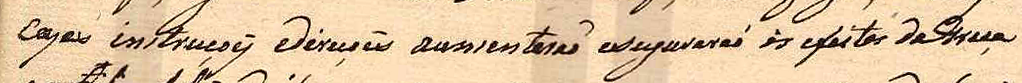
cujas instruçoẽs e direçoẽs aumentaraõ e seguraraõ os efeitos da Graça
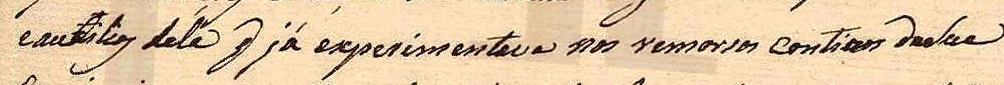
e au_ilios dela q̄ já experimentava nos remorsos continos da Sua
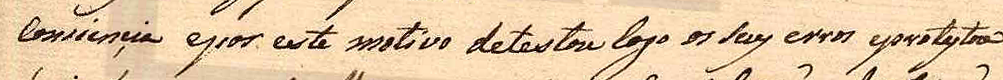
consiencia e por este motivo detestou logo os seus erros e protestou
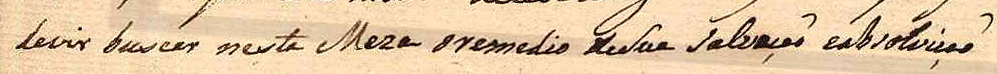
de vir buscar nesta Meza o remedio de sua salvaçaõ e absolviçaõ
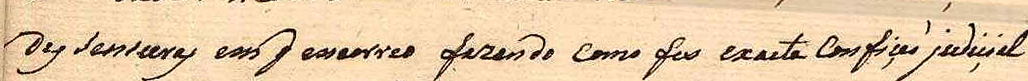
das sensuras em q̄ encorreo fazendo como fes exacta confiçaõ judicial
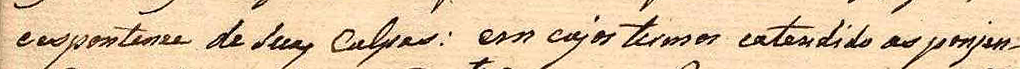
e espontanae de suas culpas: em cujos termos, e atendido as ponjen
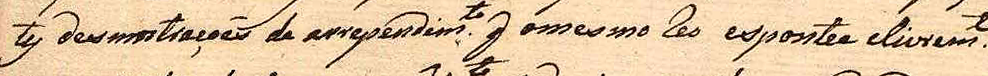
tes desmostraçoẽs de arrependim.to q̄ o mesmo Reo espontea e livrem.te
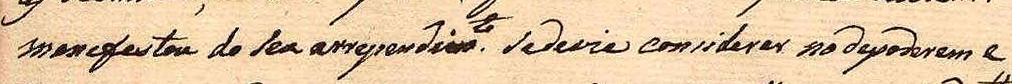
manefestou do seu arrependim.to se devia considerar no de poderem, e
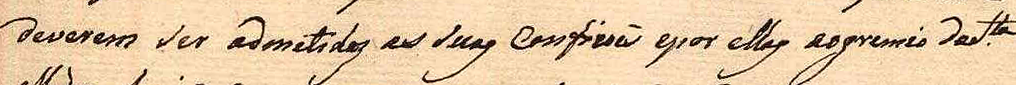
deverem ser admetidas as suas confiçoẽs e por ellas ao gremio da s.ta
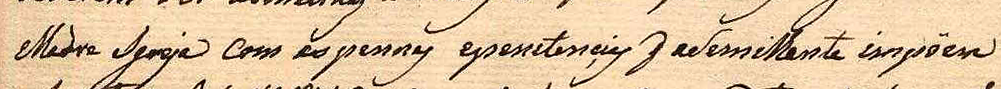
Madre Igreja com as pennas e penitencias q̄ a Semilhante impõem
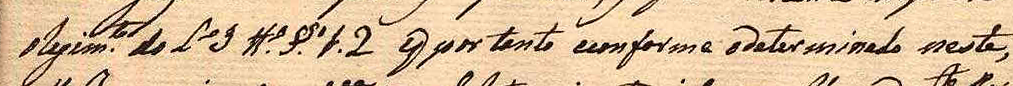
o Regim.to do L.o I tt.o §.o 1.2 e q̄ portanto e conforme o determinado neste,
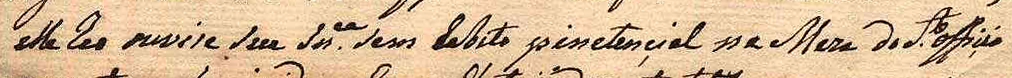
elle Reo ouvise sua sen.ca sem habito penetencial na Meza do S.to officio
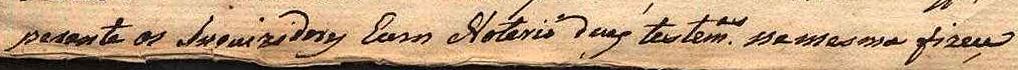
perante os Inquizidores hum Notario duas testem.as na mesma fizece
